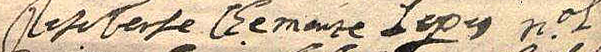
Reseberse Clemente Lopes n.aL
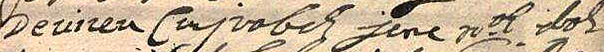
de uizeu Com Jzabel jorie n.al dal
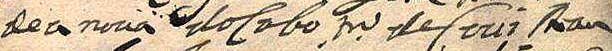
dea noua do Cabo tr.o de Couilham
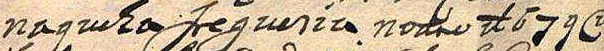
naquela freguesia no ano d̄ 679 e
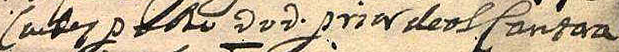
Com despacho do d. prior de aLCantara
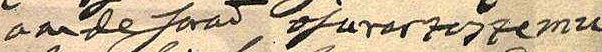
aonde foraõ a jurar testemu
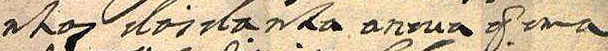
nhas da idanha a noua q̄ o ma
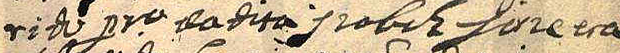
rido pr.o da dita jzabel jorie era
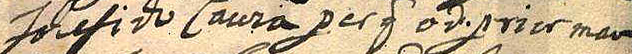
falesido Cauza per q̄ o d. prior man
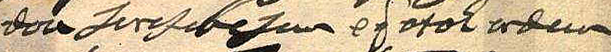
dou se resebesem e q̄ a tal ordem
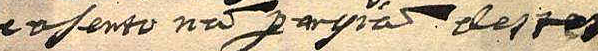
e asento naõ paresiaõ destes
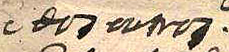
e dos outros.
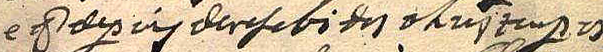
e q̄ depois de resebidos a hus̄ tempos
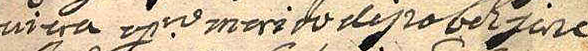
uiera o pro. marido de jzabel jorie
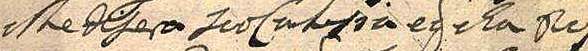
e lhe disera se o Conhesia e q̄ ela Res
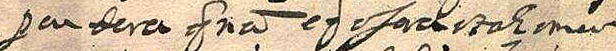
pondera q̄ naõ e q̄ o fora o tal omem
